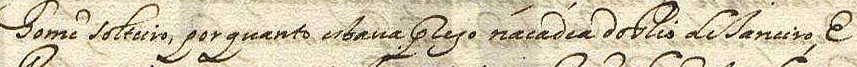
homē solteiro, porquanto estaua prezo na cadea do Rio de Ianeiro, E
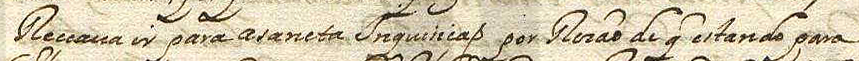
Receaua ir para a sancta Inquisiçaõ por Rezão de q̄ estando para
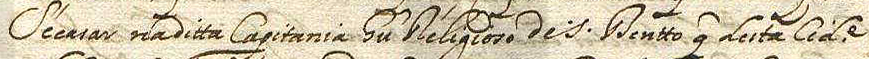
Se casar na ditta Capitania hū Religioso de S. Bentto q̄ desta Cid.e
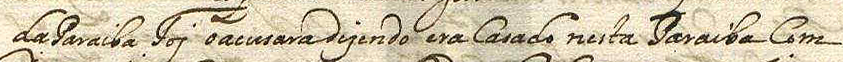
da Paraiba Foj o acusara dizendo era Casado nesta Paraiba Com
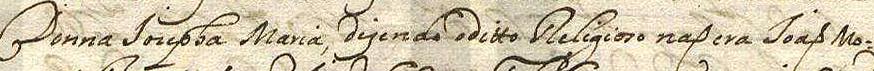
Donna Iozepha Maria, dizendo o ditto Religioso naõ era Ioaõ Mo
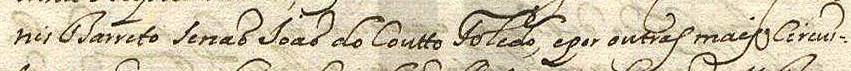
nis Barreto, senaõ Ioaõ do Coutto Toledo, e por outras mais circūs
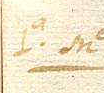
1. Mer
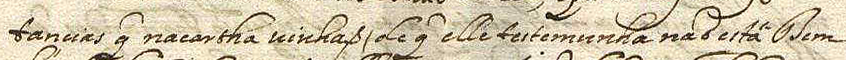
tancias q̄ na cartha uinhaõ (de q̄ elle testemunha naõ está Bem
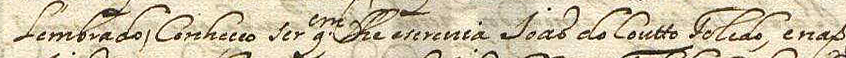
Lembrado) Conheceo ser q.em lhe escreuia Ioaõ do Coutto Toledo, e naõ
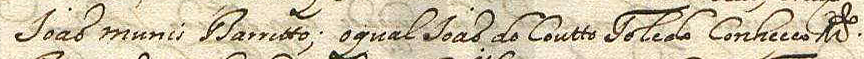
Joaõ munis Barretto; o qual Ioaõ do Coutto Toledo Conheceo M.to
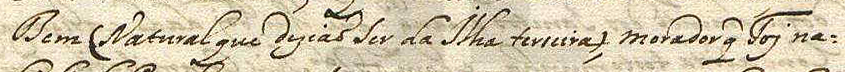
Bem (Natural que deziaõ ser da Ilha terceira), morador q̄ Foj na
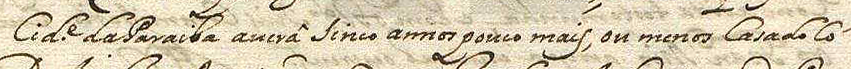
Cid.e da Paraiba auerâ sinco annos pouco mais, ou menos Casado Co
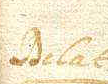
Delato
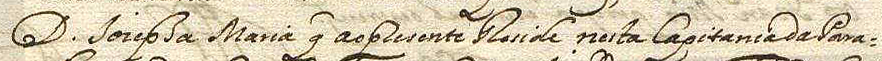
D. Iozepha Maria q̄ ao presente Reside nesta Capitania da Para
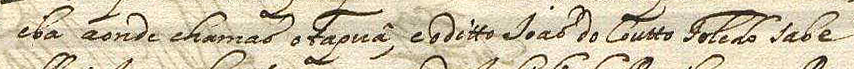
iba aonde chamaõ o Tapuâ, e o ditto Ioaõ do Coutto Toledo sabe
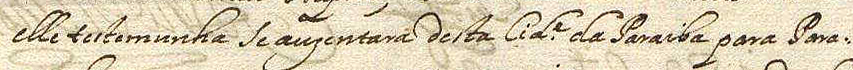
elle testemunha se auzentara desta Cid.e da Paraiba para Para
